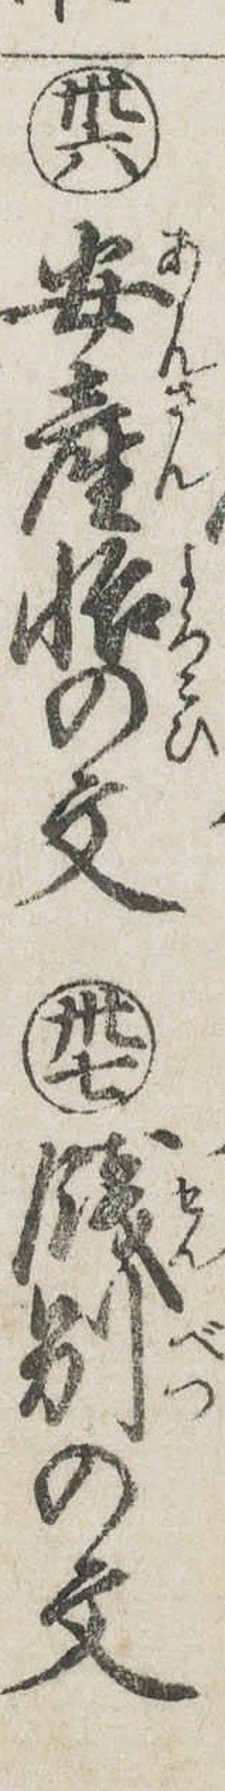(卅六)安産怡の文(卅七)餞別の文
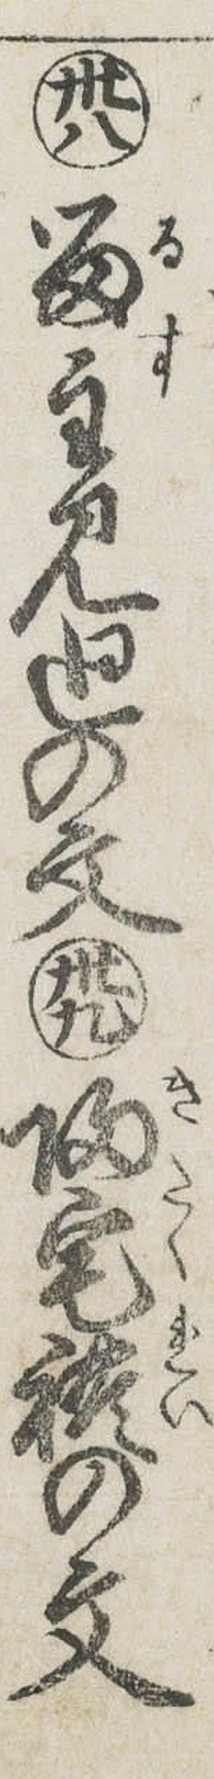(卅八)留主見廻の文(卅九)帰宅礼の文
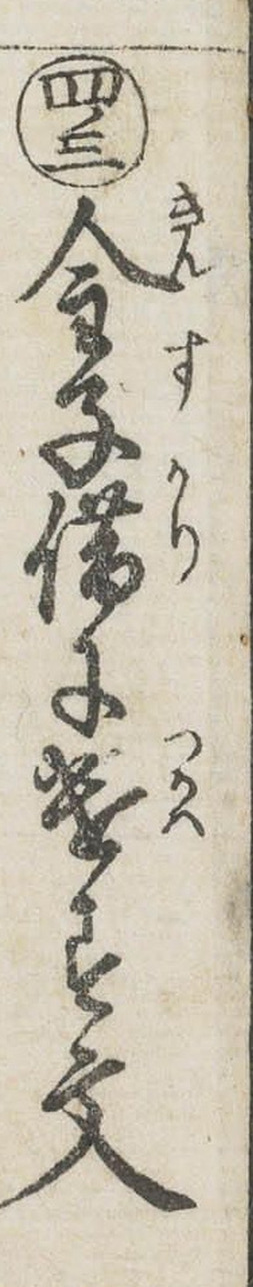(四ノ三)金子借に遣す文
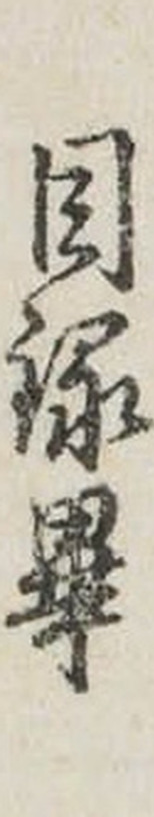目録終
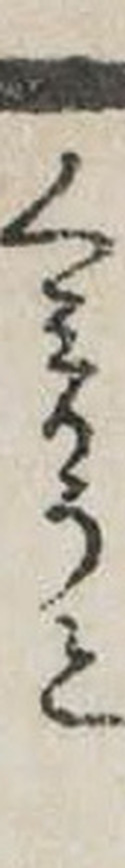くみかうと
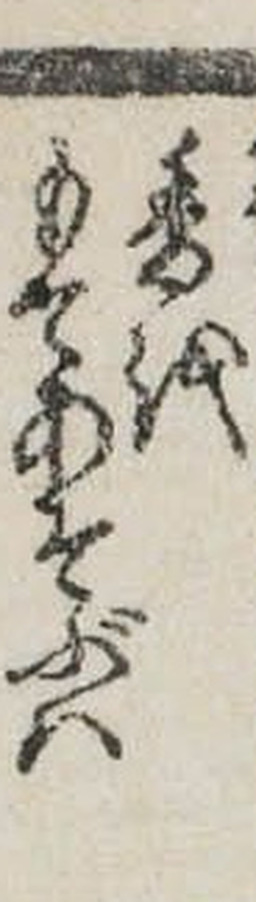もてあそぶは
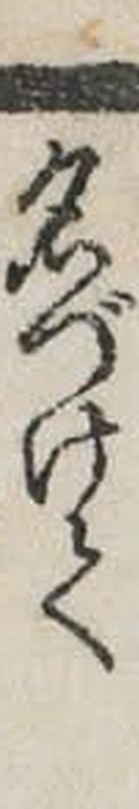名づけて
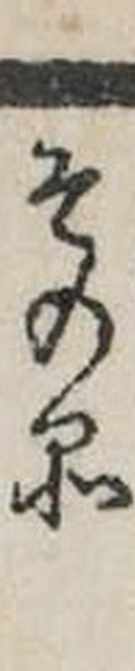その品
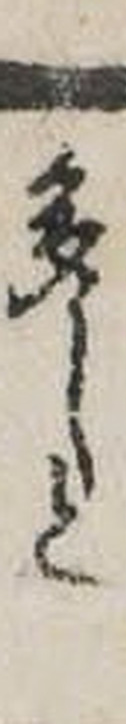多しと
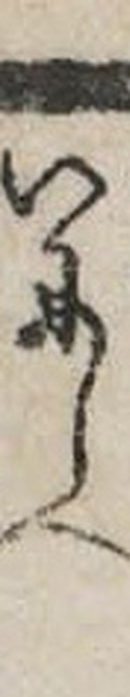いにしへ
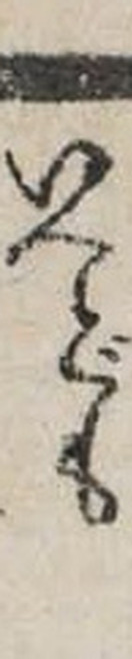いへども
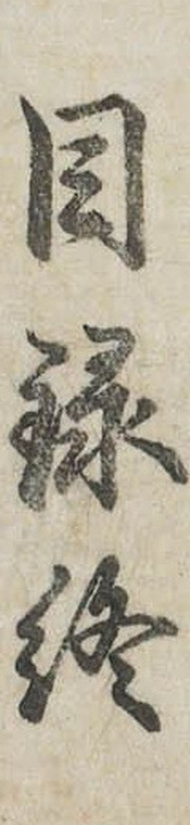目録終
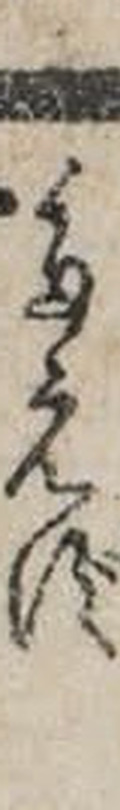たえず
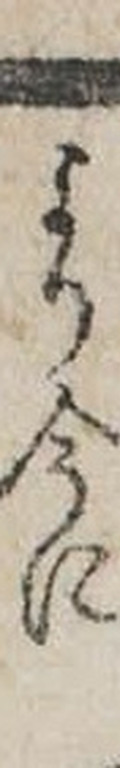より今に
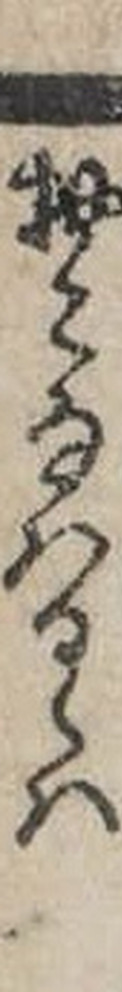おこなはるゝは

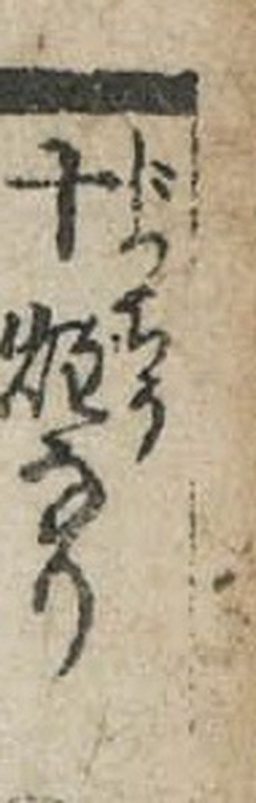十炷なり
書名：頭書萬用婦人手紙之文言
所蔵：東京学芸大学教育コンテンツアーカイブ
